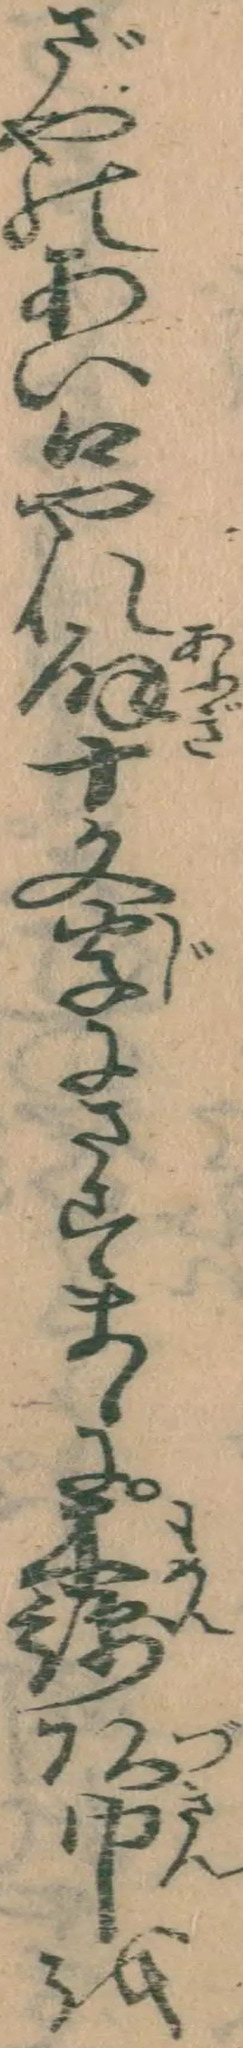ざやのあい口やれ扇十文字にさすまゝに。木綿頭巾を
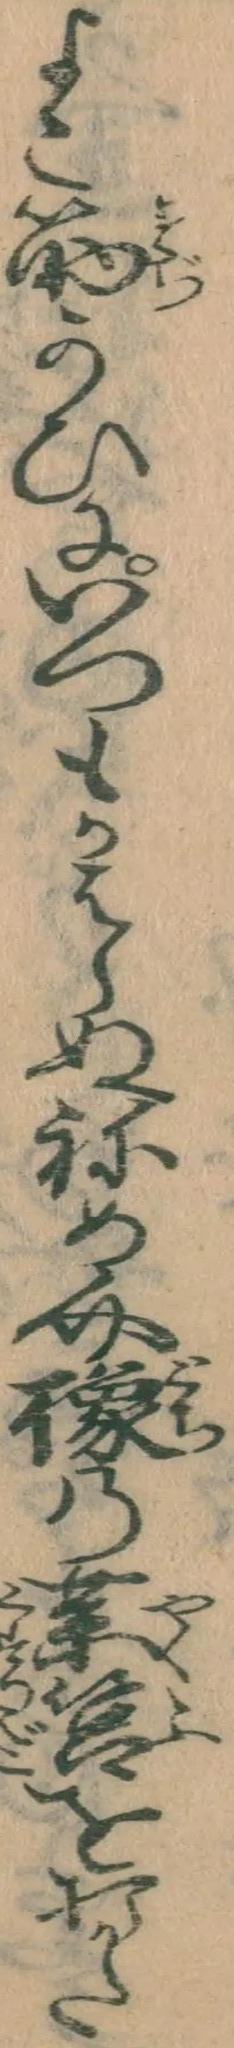よこ筋かひに。いつもかはらぬねめ介橡の薬筥を打かた
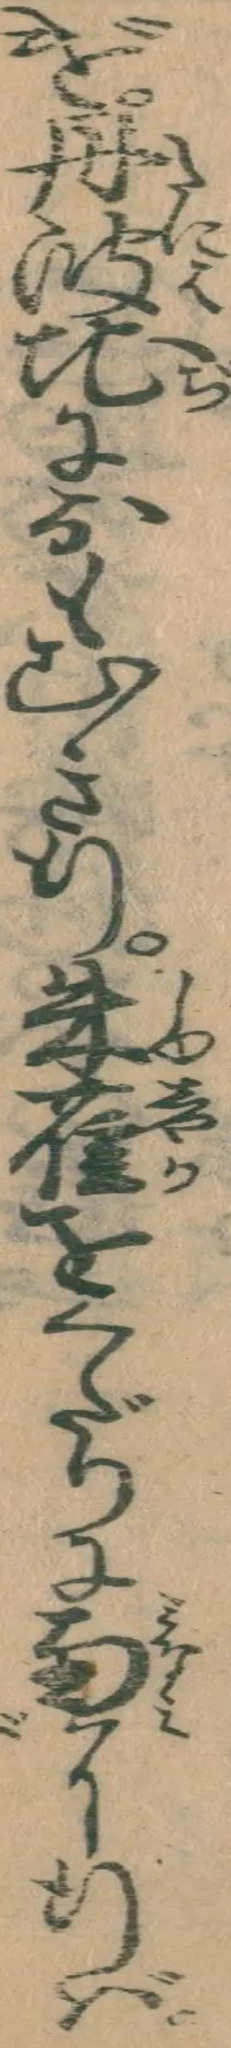げ。丹波地におもむき行。朱雀をくだりに南に行ば。
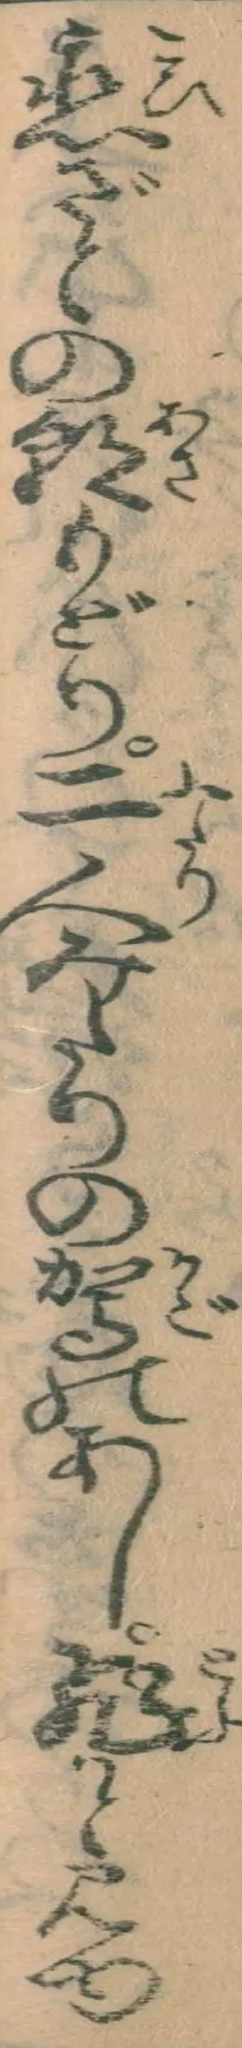恋ざとの朝もどり。二人みたりの駕のあし。飛かと見ゆ
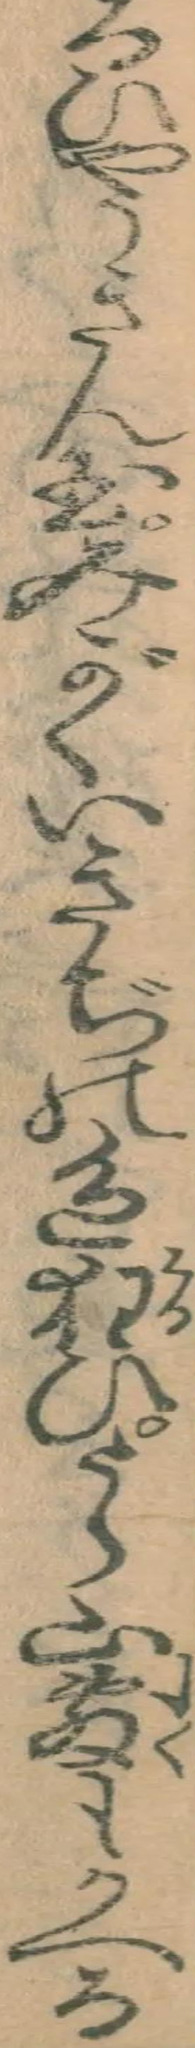るひやうきん玉。みがくいきぢの色狂ひ。うら山敷もかへる
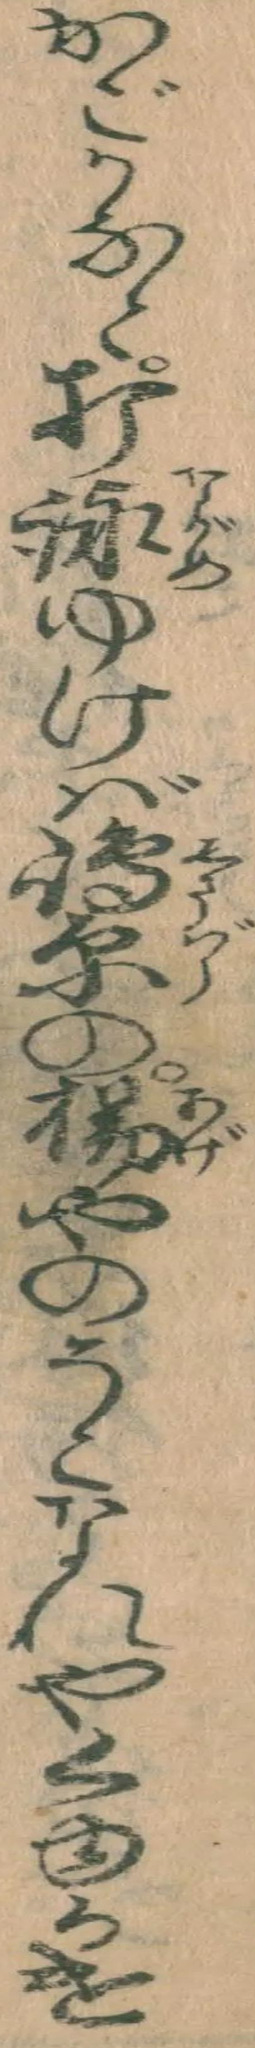かごかなと。打詠ゆけば島原の。楊やのそこなれやくゆるけ
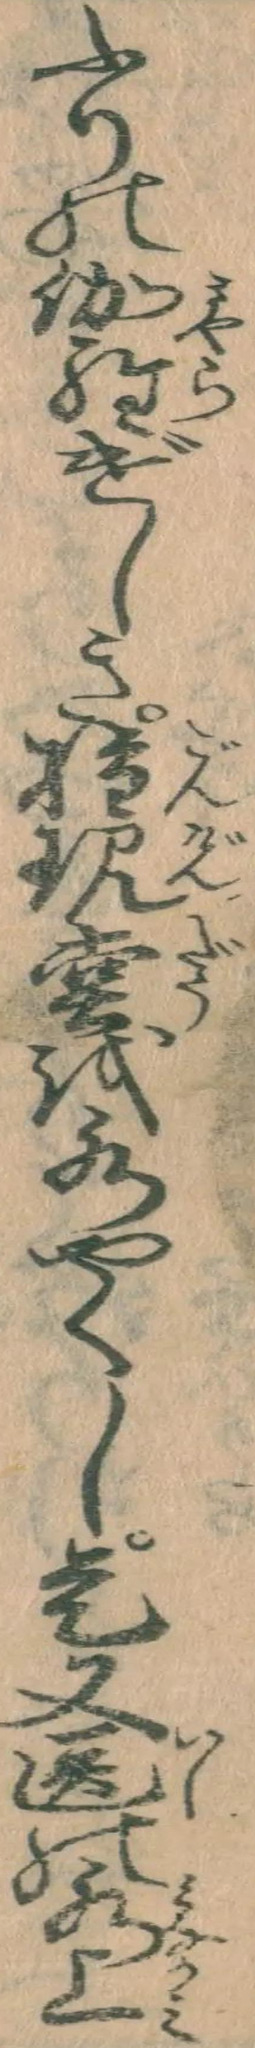ふりの伽羅げしき。権現堂を水やくし。是又医の水上
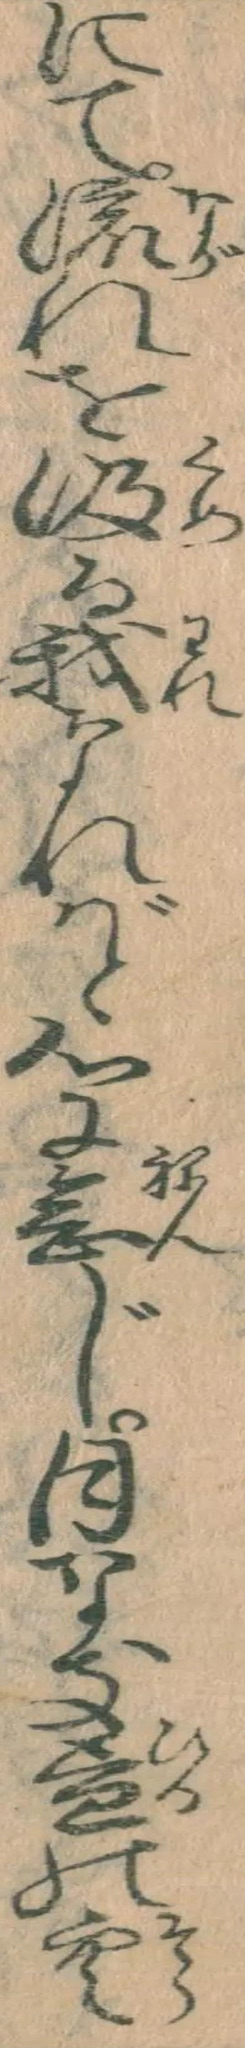にて。流れを汲る我なればと心に念じ。月なき昼の空
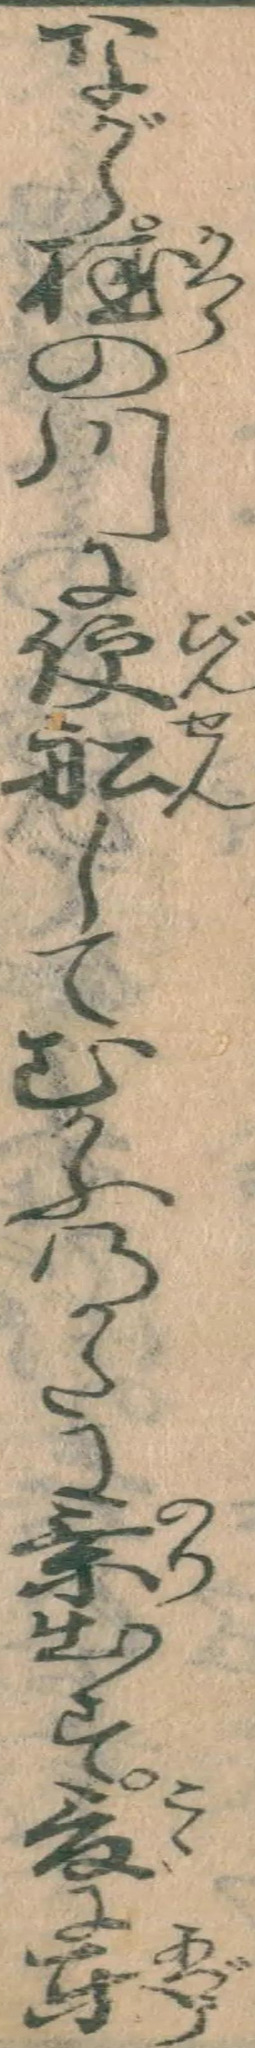ながら。桂の川に便船してむかふのかたに乗出す。爰に東
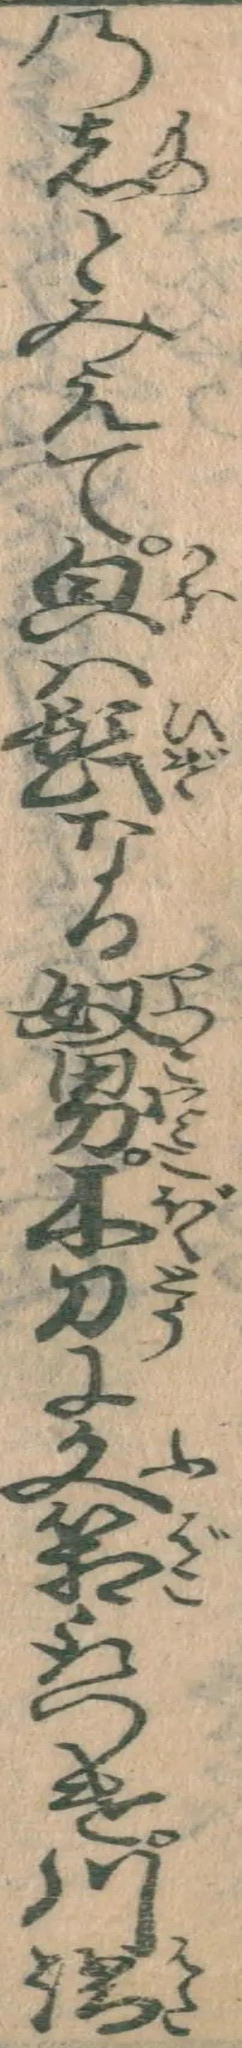の者とみえて。貌は髭なる奴男。木刀に文箱取つけ。川端
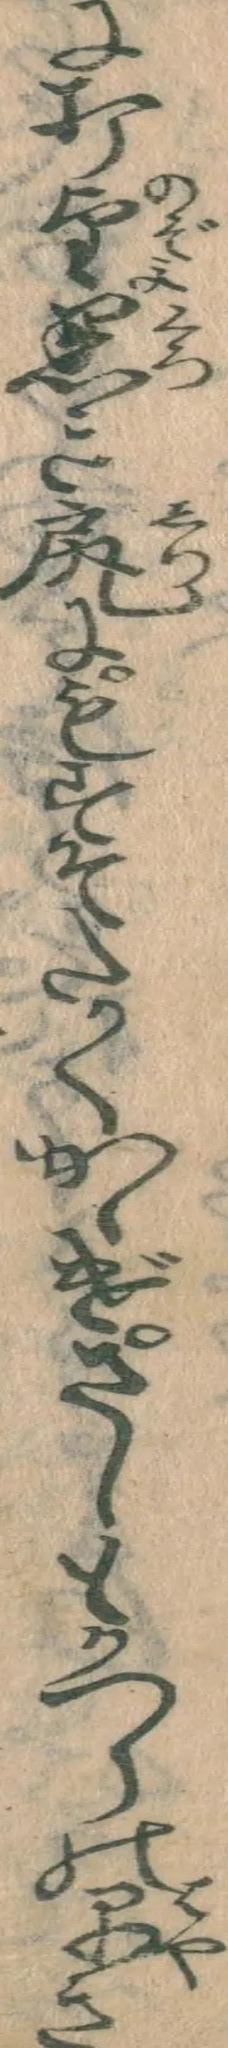に打望黒き尻に。もすそたかくかゝげ。さしもかつらの早き
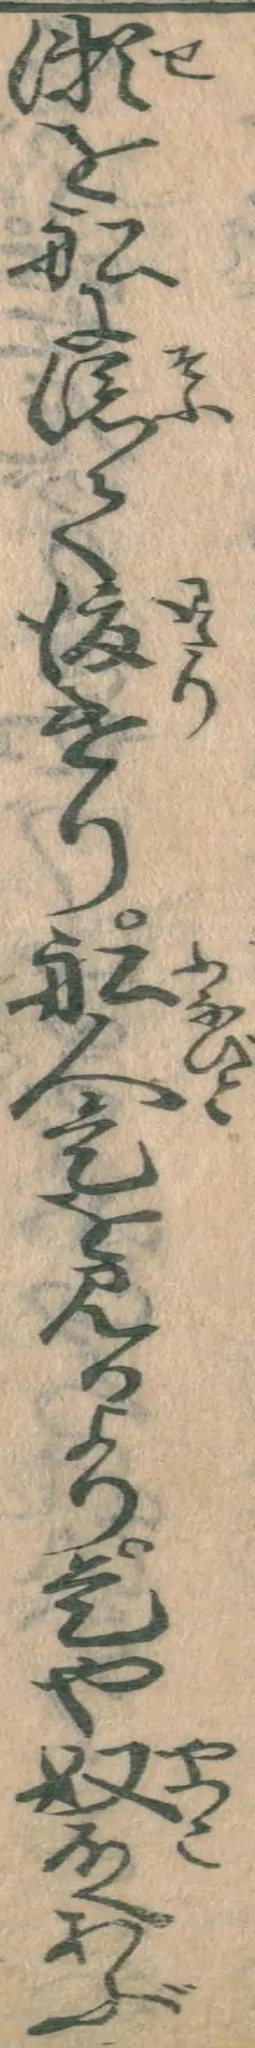瀬を船に添て渡けり。船人是を見るより。是や奴殿あぶ
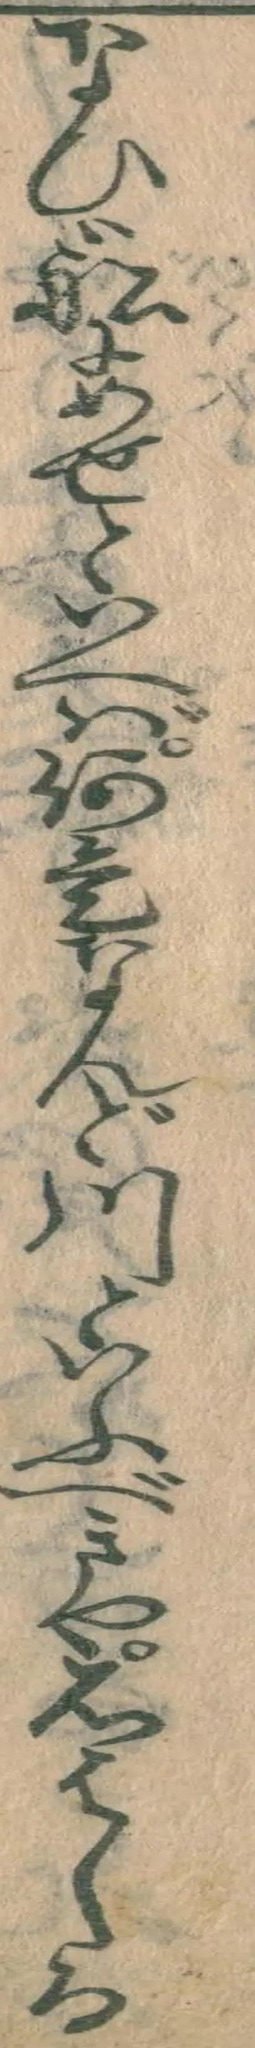なひは船にめせといへば。何是なんど川といふべきや。石はしる
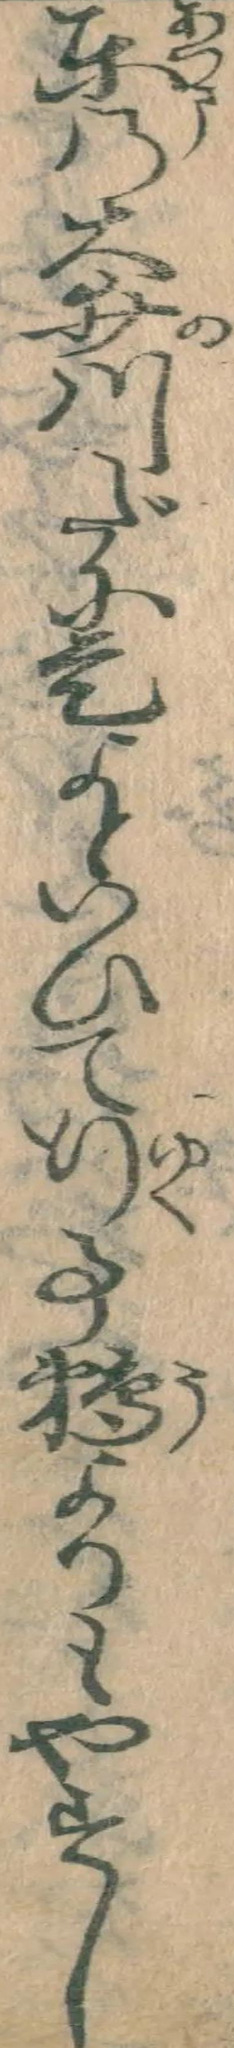東の大井川だに是よといひて行事鵜よりもやすし
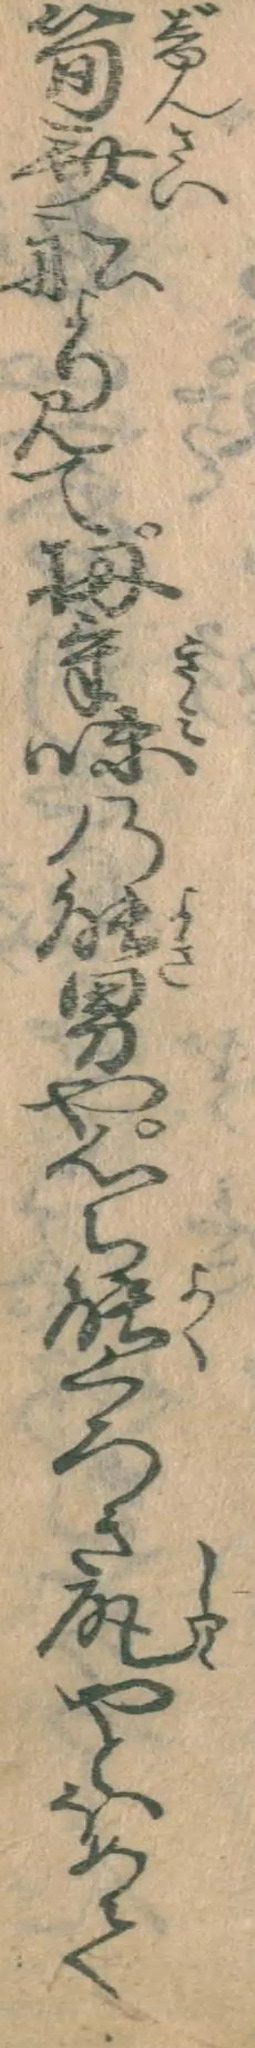筍斎船より見て。扨気味の能男や。心ち能くろき尻やとほめて

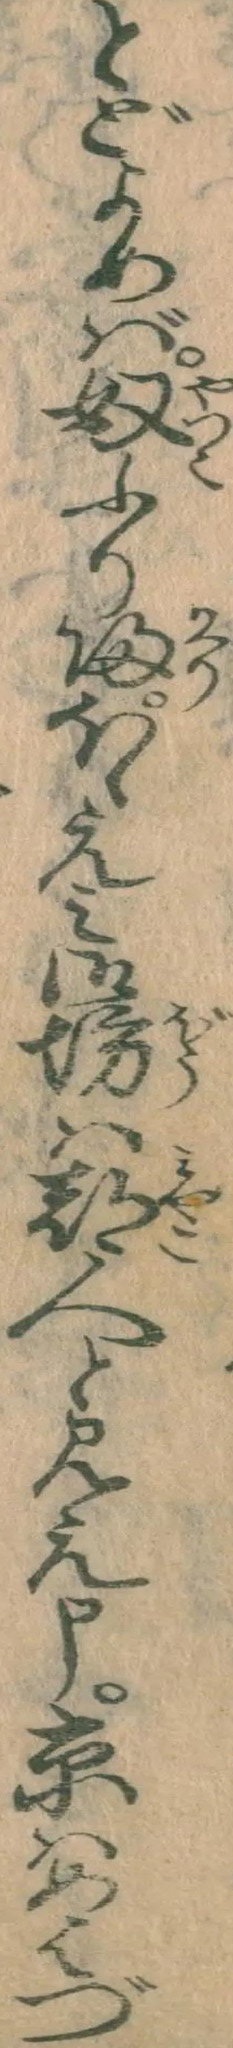とどよめば。奴ふり帰。ほゝえみ御坊は都人と見え申。京はめはづ
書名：新竹斎 5巻
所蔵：国立国会図書館 National Diet Library, JAPAN
